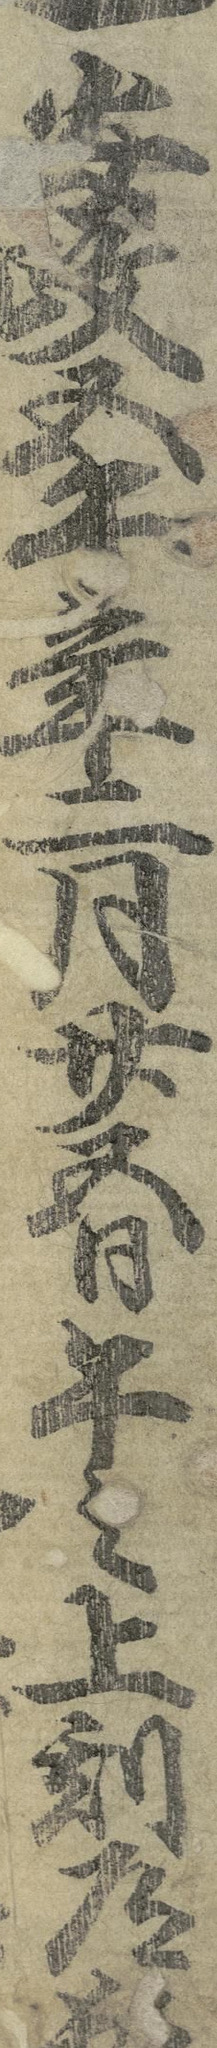安政五午年二月廿五日午之上刻道頓堀角
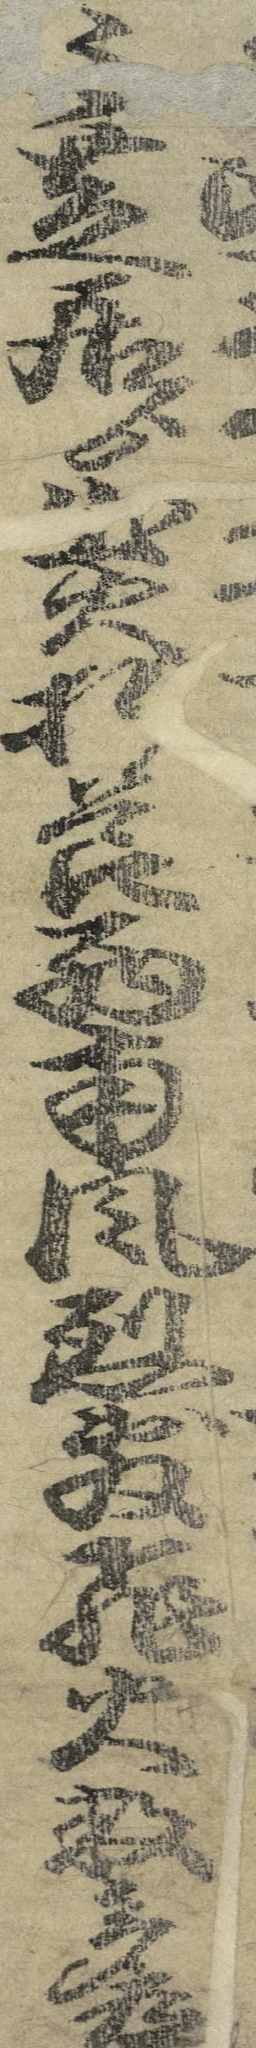之芝居ゟ出火折節西南風烈敷飛火数多有
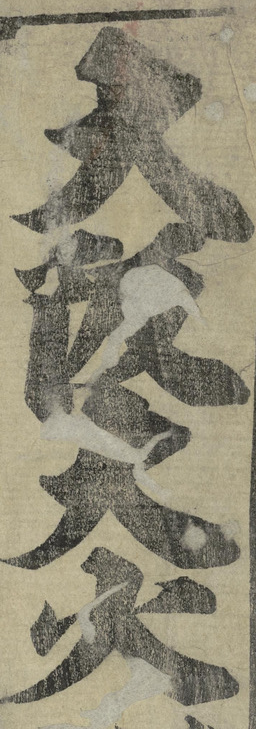大阪大火
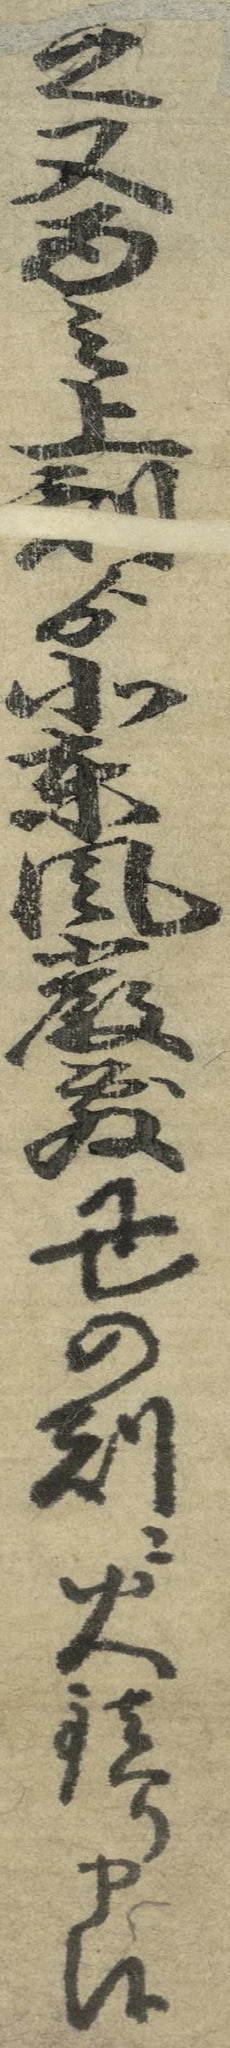之又酉之上刻ゟ北東風厳敷丑の刻に火鎮り申候
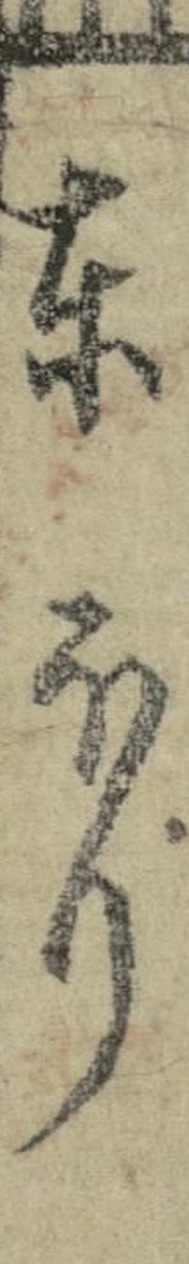東ほり
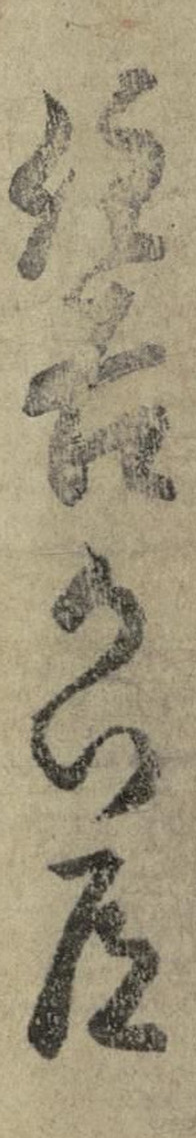住吉かい道
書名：大阪大火
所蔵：東京大学地震研究所図書室 Earthquake Research Institute Library, The University of Tokyo, JAPAN
